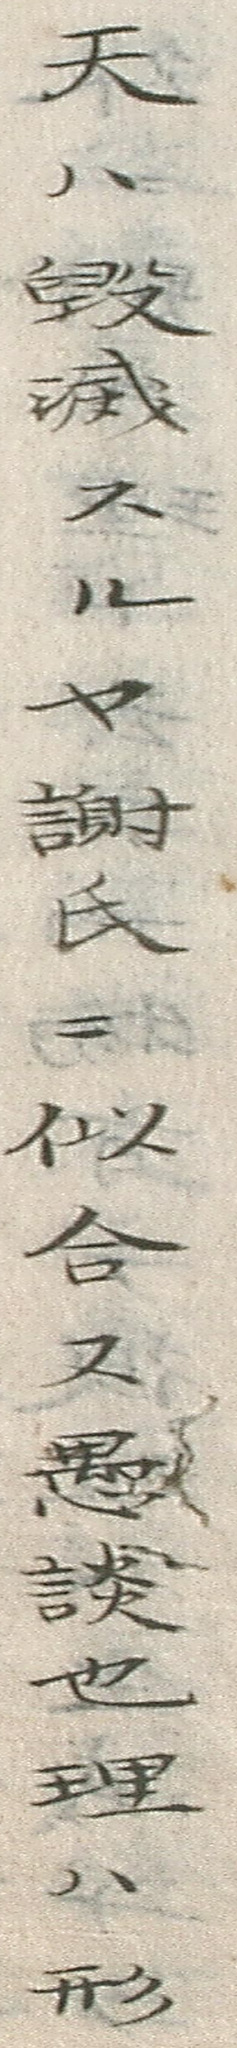天ハ毀滅スルヤ謝氏ニ似合ス愚談也理ハ形
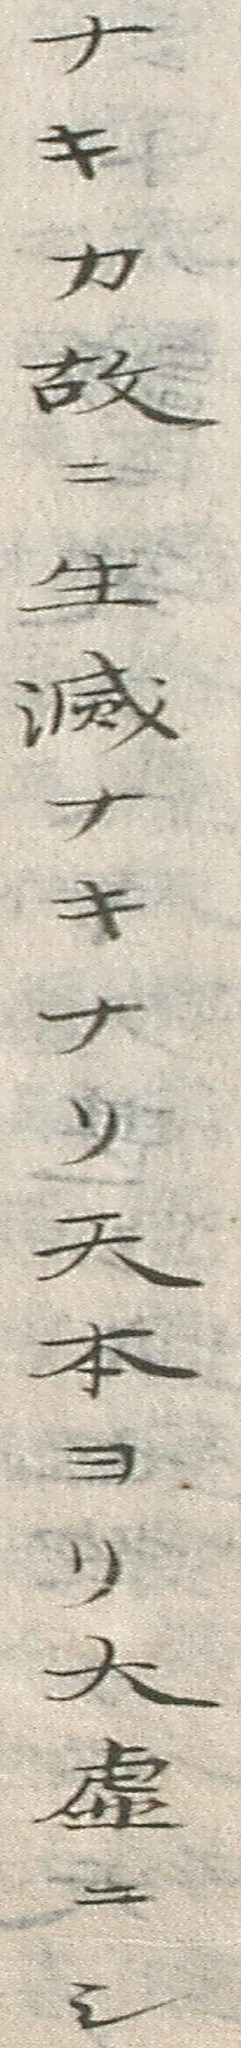ナキカ故ニ生滅ナキナリ天本ヨリ大虚ニシ
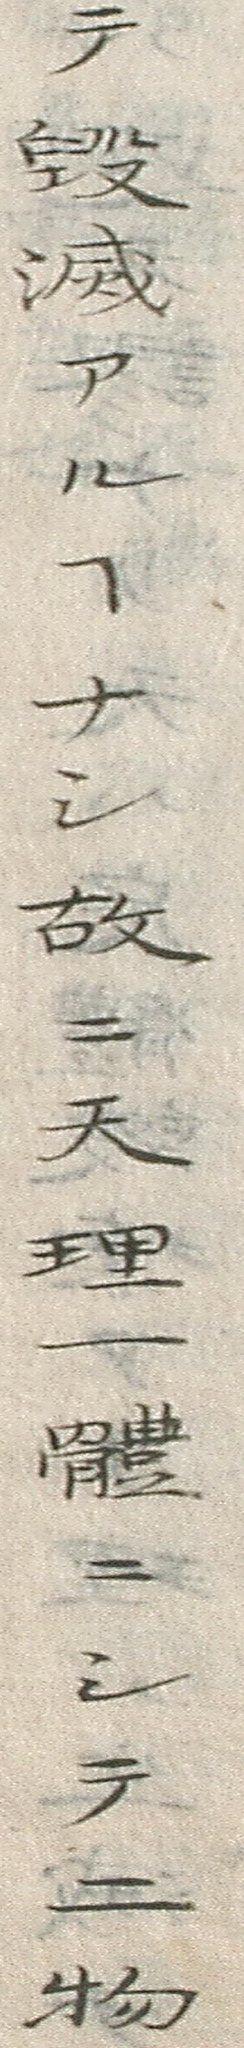テ毀滅アルコトナシ故ニ天理一体ニシテ物
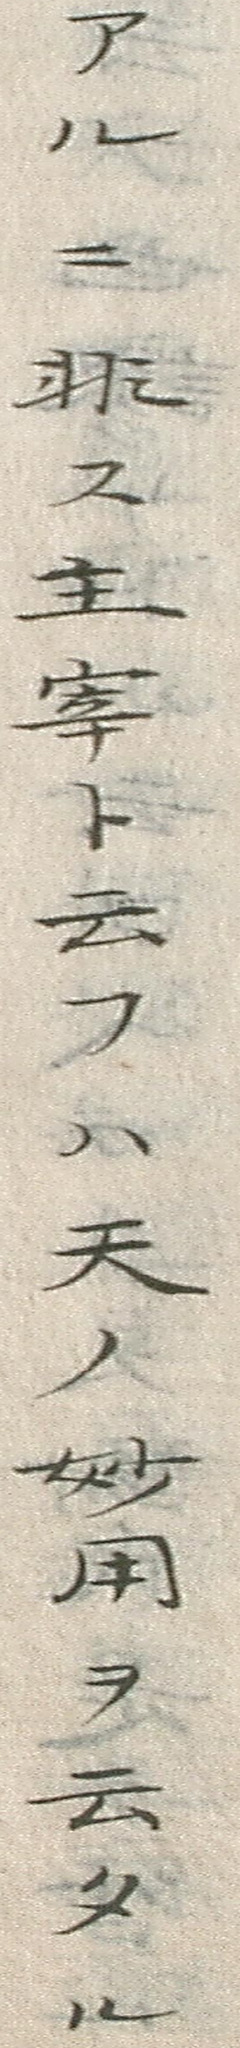アルニ非ス主宰ト云フハ天ノ妙用ヲ云タル
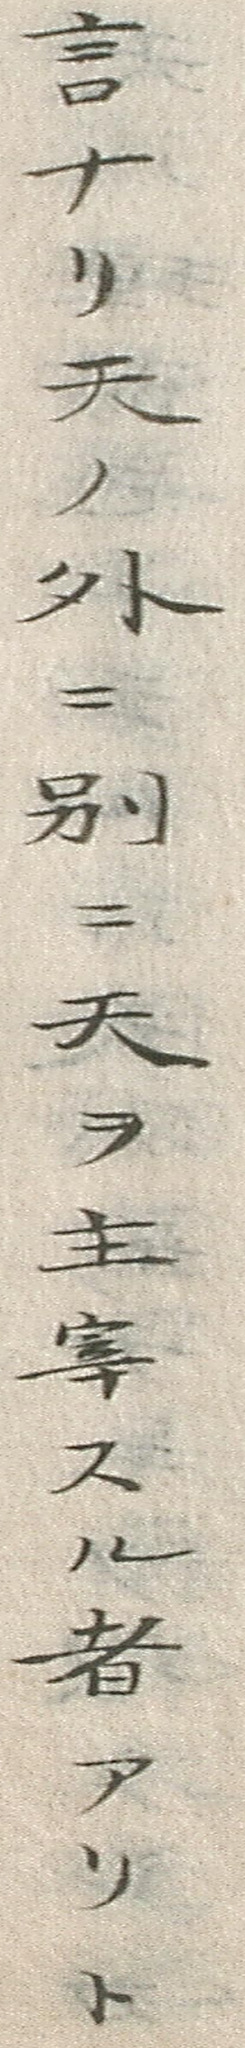言ナリ天ノ外ニ別ニ天ヲ主宰スル者アリト
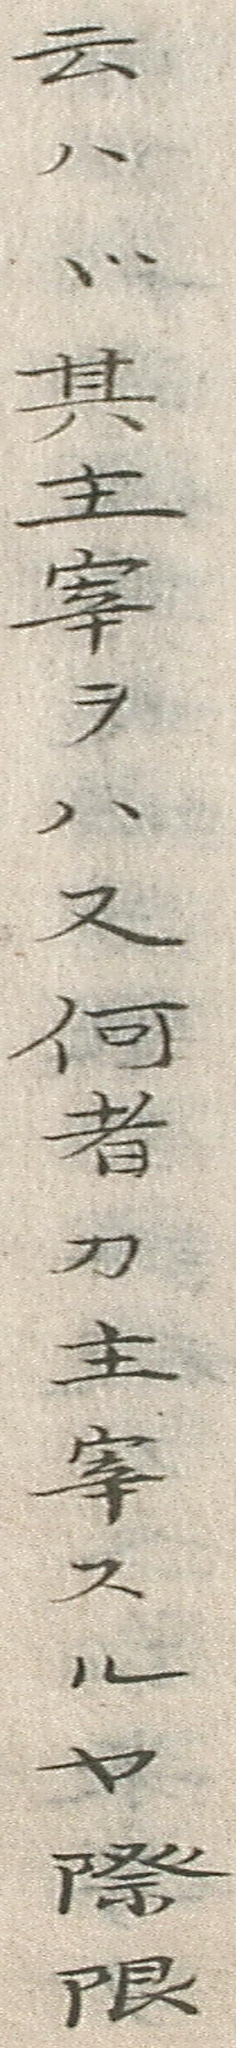云ハヾ其主宰ヲハ又何者カ主宰スルヤ際限
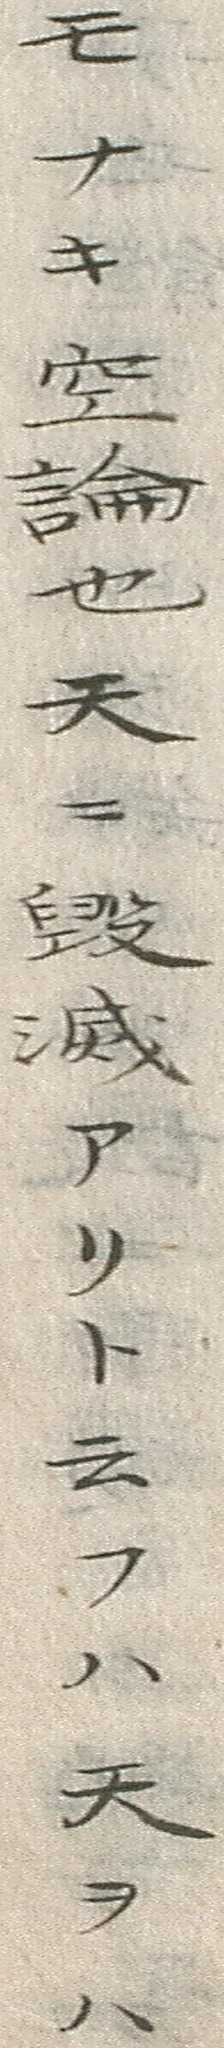モナキ空論也天ニ毀滅アリト云フハ天ヲハ
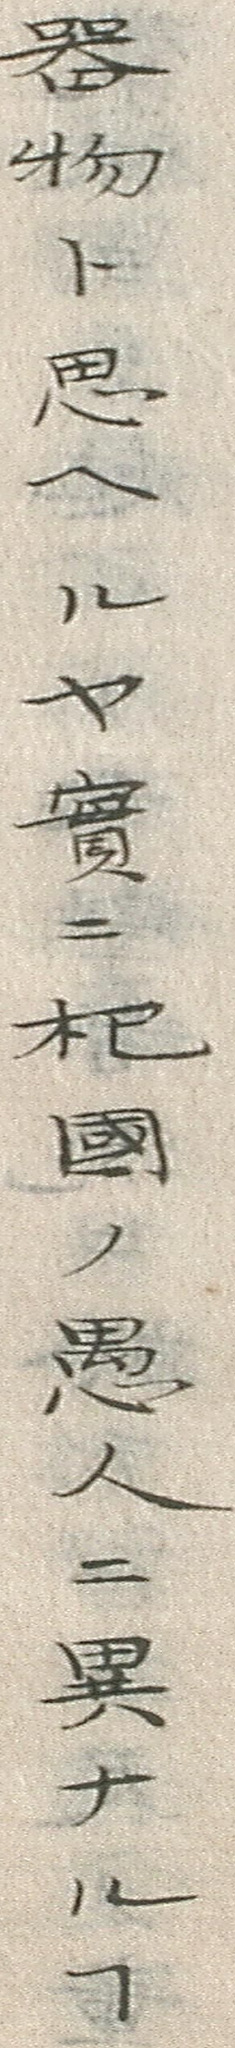器物ト思ヘルヤ実ニ杞国ノ愚人ニ異ナルコト
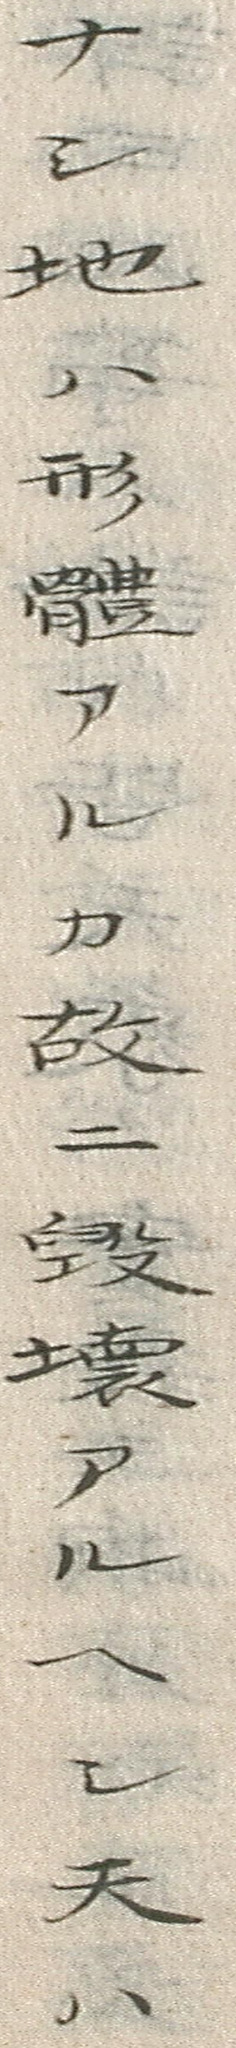ナシ地ハ形体アルカ故ニ毀壊アルヘシ天ハ
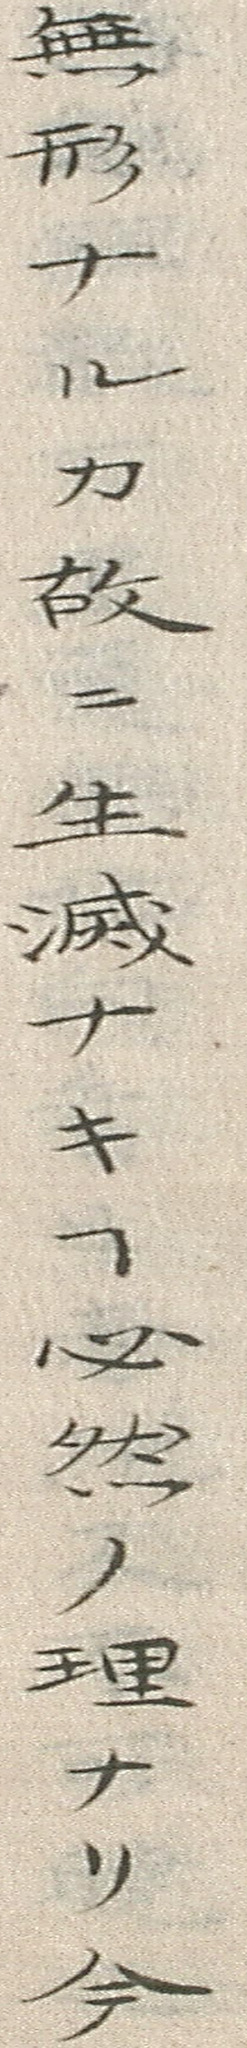無形ナルカ故ニ生滅ナキコト必然ノ理ナリ今
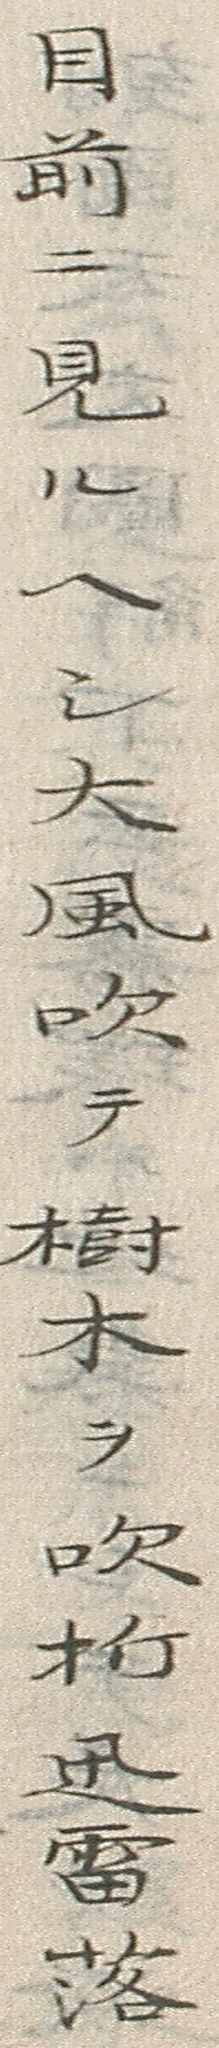目前ニ見ルヘシ大風吹テ樹木ヲ吹析迅雷落
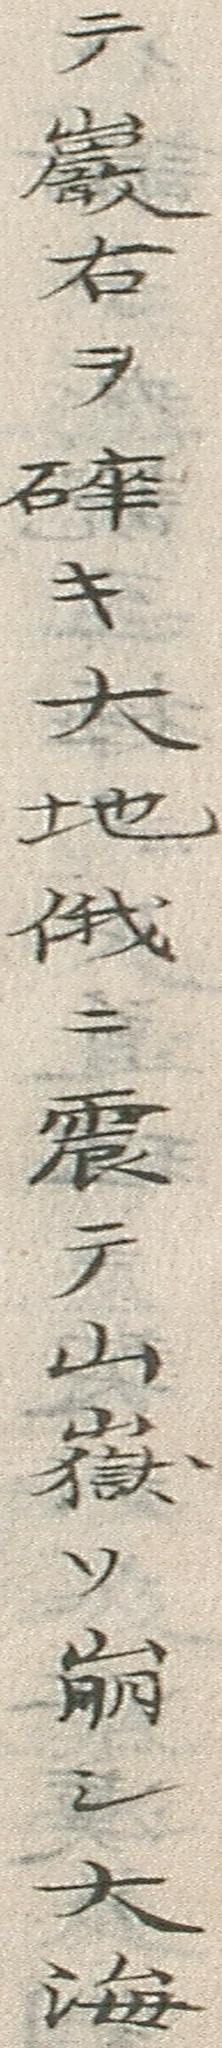テ巖右ヲ碎キ大地俄ニ震テ山嶽ソ崩シ大海
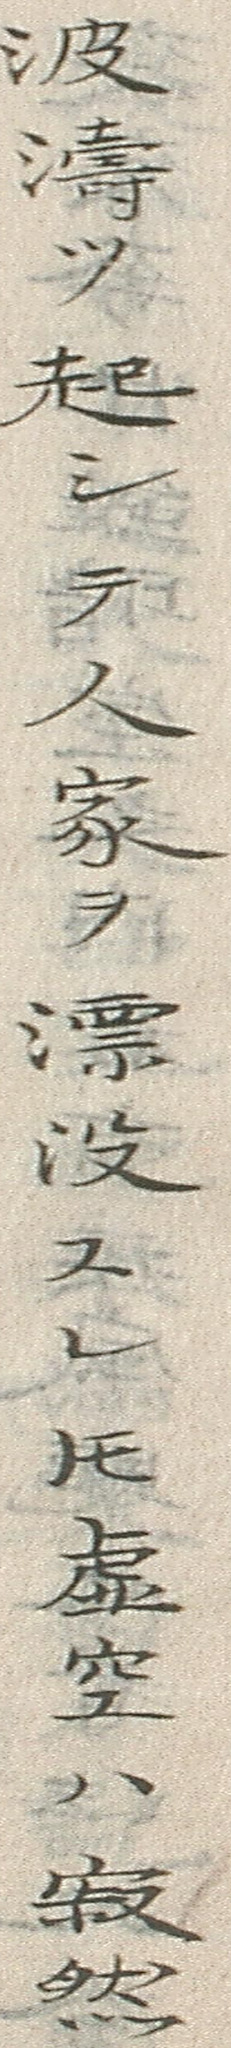波濤ッ起シテ人家ヲ漂没スレトモ虚空ハ寂然
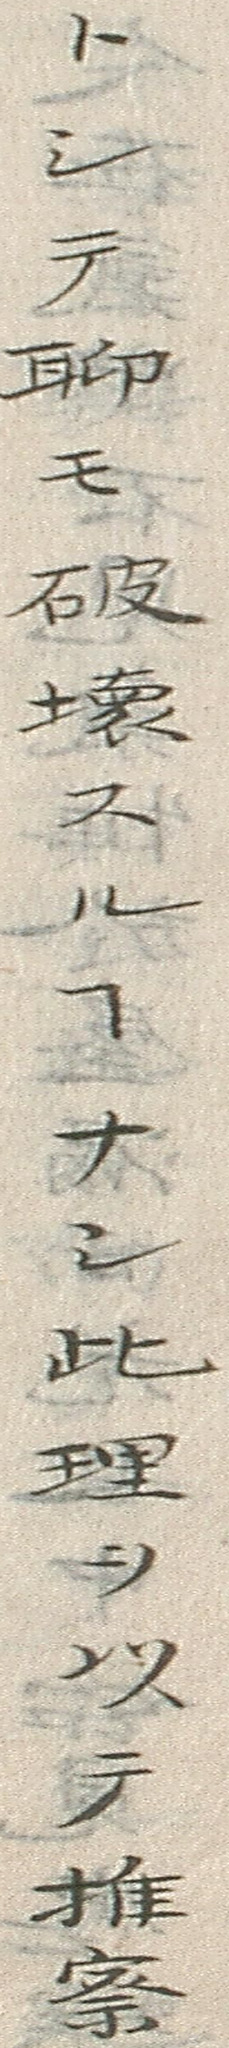トシテ聊モ破壊スルコトナシ此理ヲ以テ推察
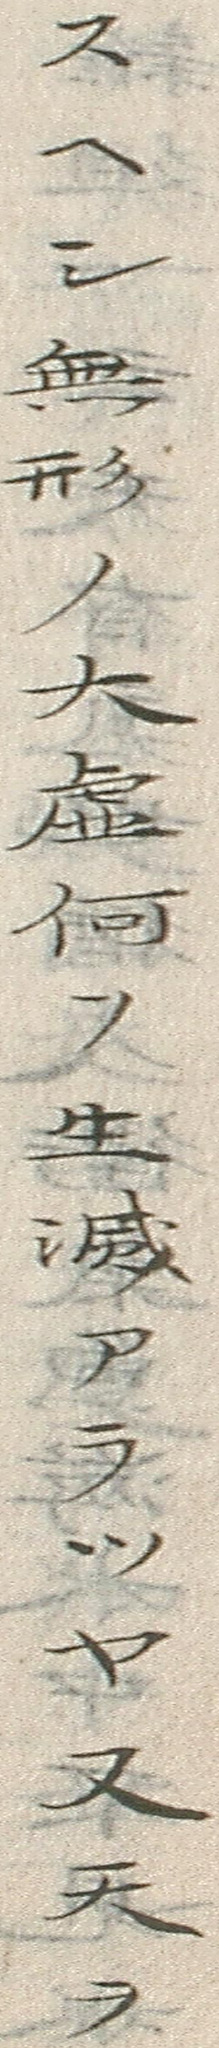スヘシ無形ノ大虚何ノ生滅アラツヤ又天ヲ
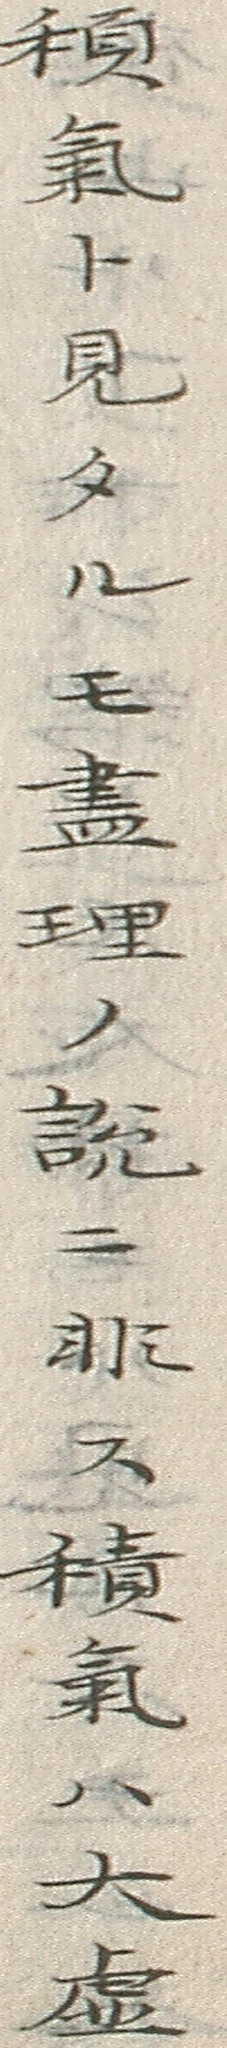䅡気ト見タルモ尽理ノ説ニ非ス積気ハ大虚
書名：天學略名目羽翼　全
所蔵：東京大学地震研究所図書室 Earthquake Research Institute Library, The University of Tokyo, JAPAN
